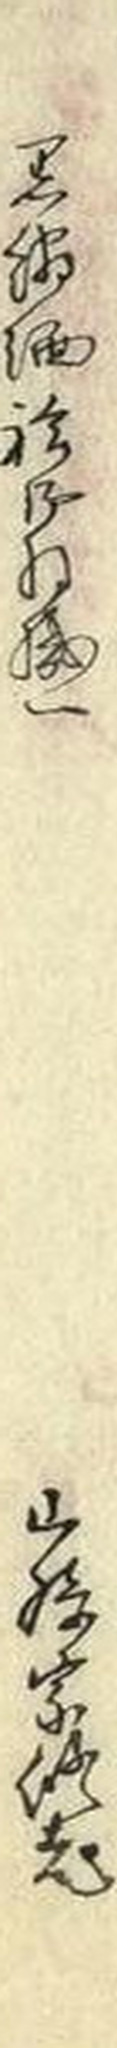黒縮緬袷御羽織一山崎宗脩老
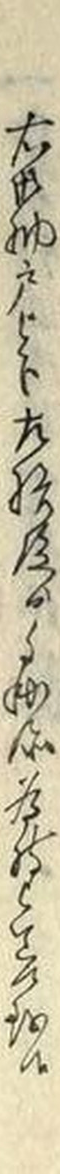右御納戸被下左膳殿ゟ手紙添為持被差越候
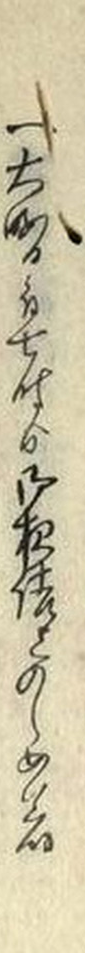一大晦日ニ付七時ゟ御夜詰迄のしめ着
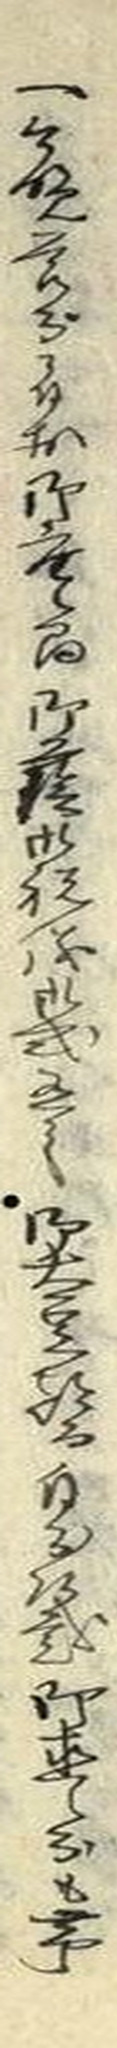一今晩節分ニ付於御座之間御蔭御祝儀御式有之御大豆都而自分頂戴御直之分も帯
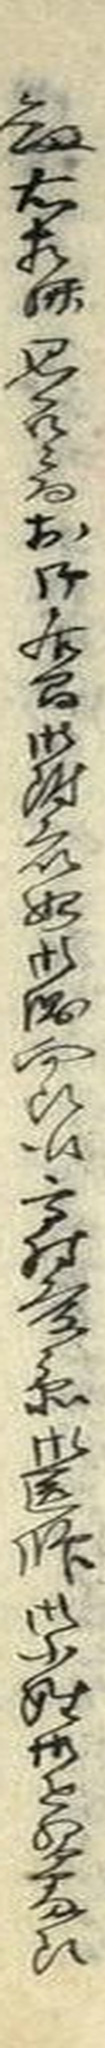剣右相済思召ニ而於御居間御附衆始御側向頭取高村藤兵衛御医師御小姓御近習番頭
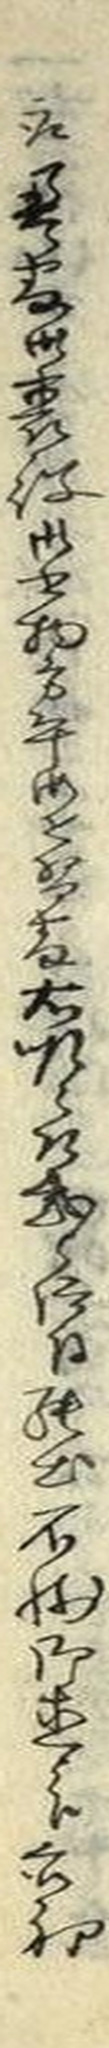取奥之番御裏役御書物方平御近習番右順々頂戴被仰付罷出不残御直被下最初
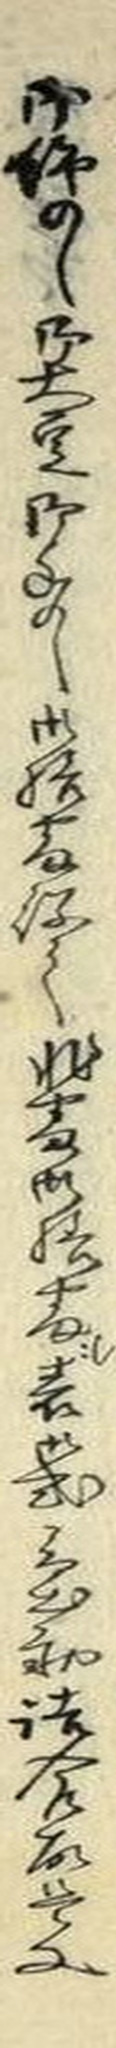御飾のし御大豆御手のし御膳番役之非番御膳番も表御式ニ而出勤詰合故是又

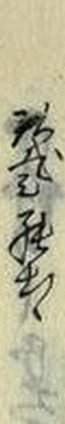頂戴罷出候
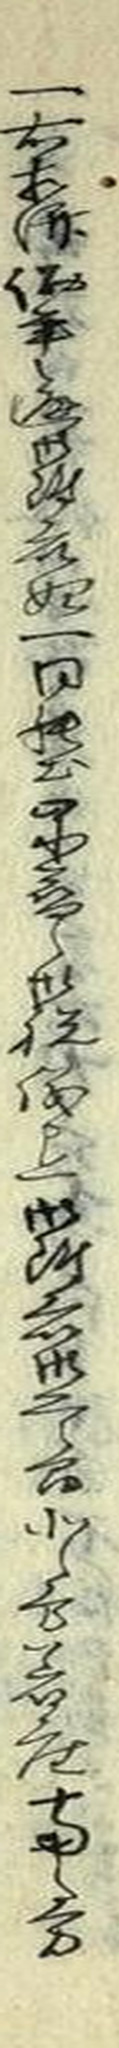一右相済例年之通御附衆始一同罷出歳暮之御祝儀申上御附衆御二之間北之方着座南之方
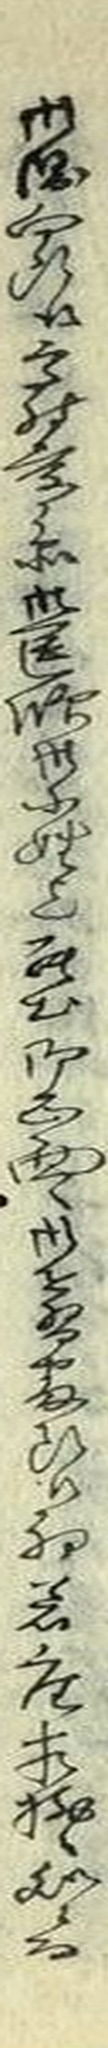御側向頭江高村藤兵衛御医師御小姓迄罷出御正面へ御近習番頭取初着座相揃候処ニ而
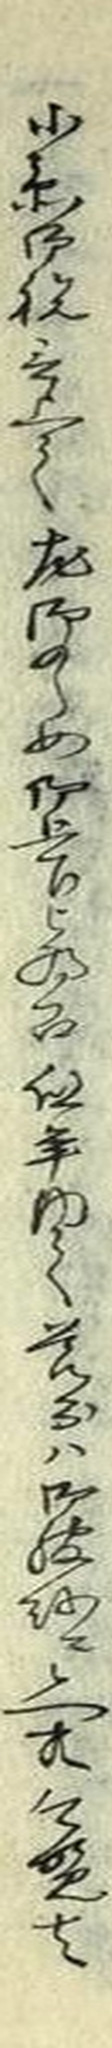小兵衛御祝言上之尤御のしめ御上下被為召但年内之節分ハ御服紗ニ候へ共今晩者
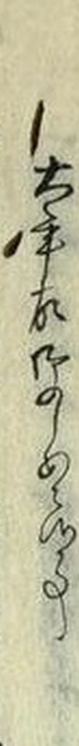大年故御のしめニ候事
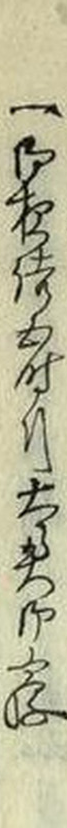一御夜詰五時引大奥御寝

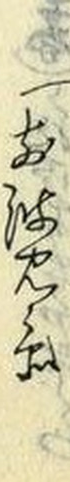前波忠兵衛
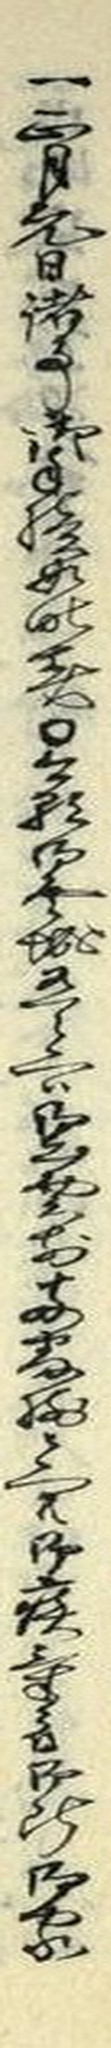一正月元日諸事御手続如昨春〇今朝御登城有之候ヘハ御出殿両番揃ニ候へ共御疾気ニ付御断御家
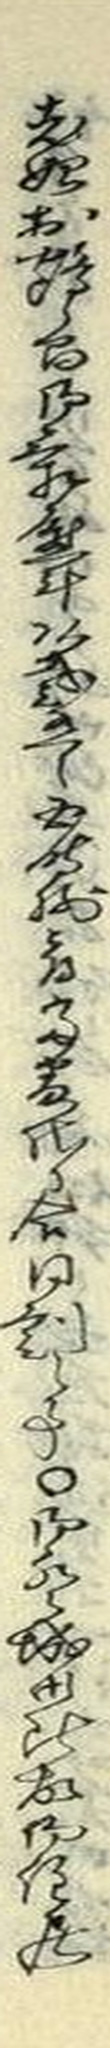老始於鶴之間御影熨斗頂戴有之五時揃ニ付当番代り合同刻之事〇御登城御断故御住居
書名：少傅日録抄（斉善付側向頭取日記、在府）
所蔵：福井県文書館 Fukui Prefectural Archives
